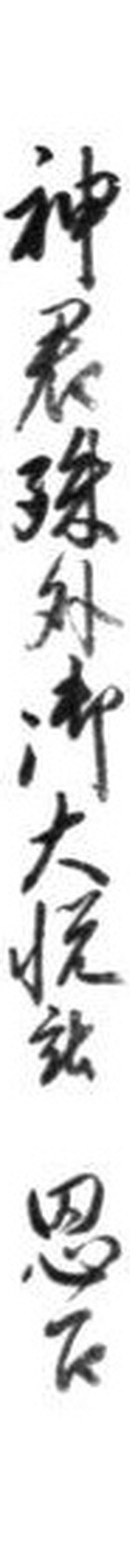神君殊外御大悦被思召
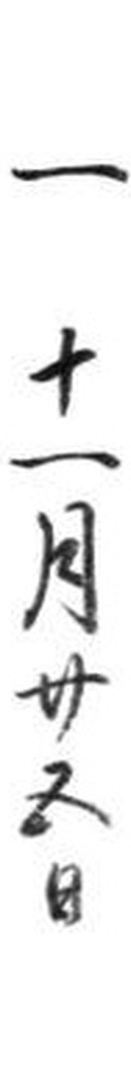一十一月廿五日
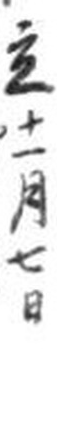一十一月廿五日
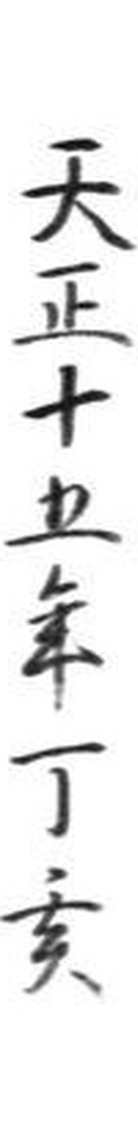天正十五年丁亥
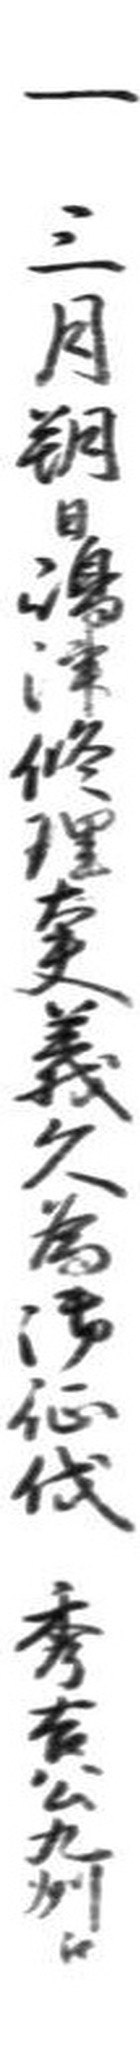一三月朔日嶋津修理大夫義久為御征伐秀吉公九州江
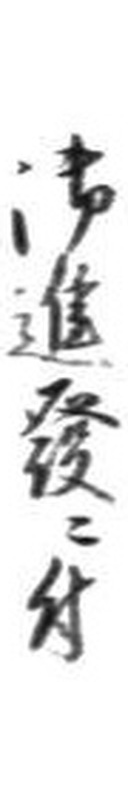御進発ニ付
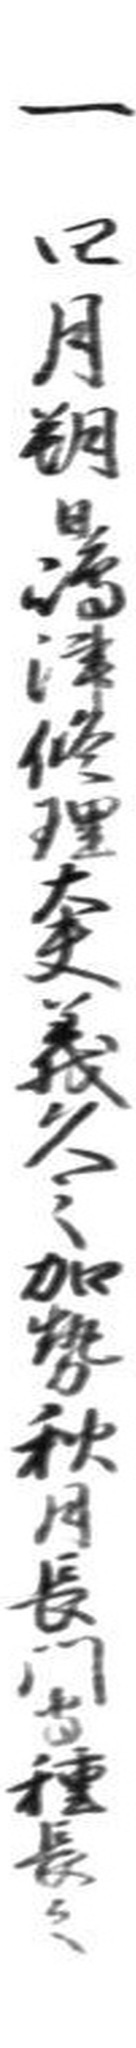一四月朔日嶋津修理大夫義久之加勢秋月長門守種長之
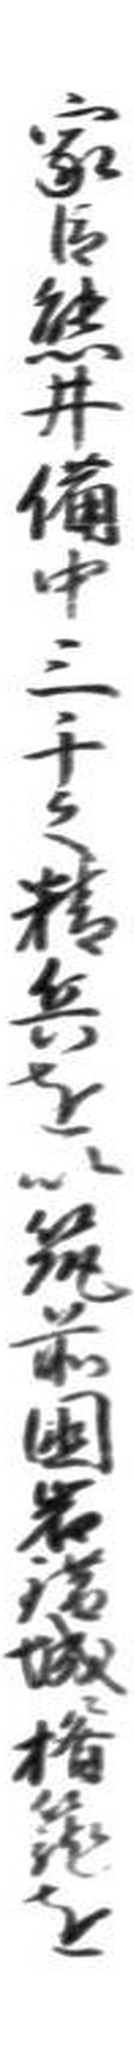家臣熊井備中三千之精兵を以筑前国岩錯城ニ楯籠を
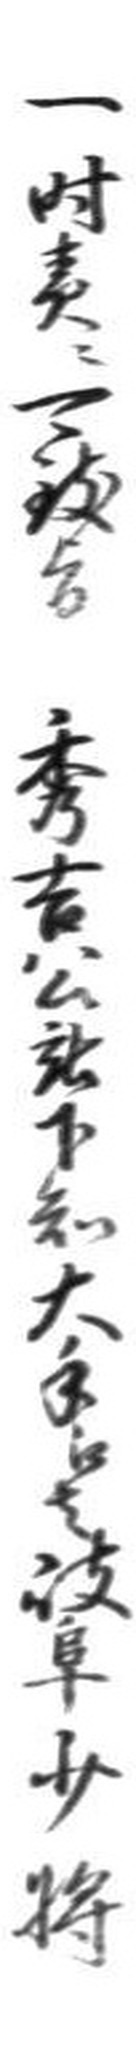一時責ニ可致旨秀吉公被下知大手江者岐阜少将
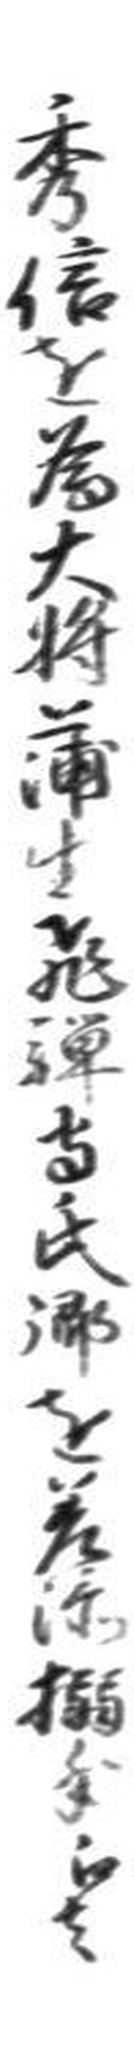秀信を為大将蒲生飛騨守氏郷を差添搦手江者
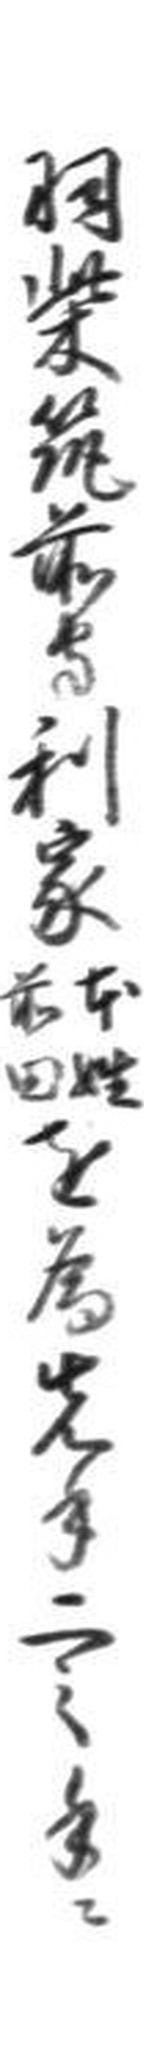羽柴筑前守利家本姓前田を為先手二之手ニ

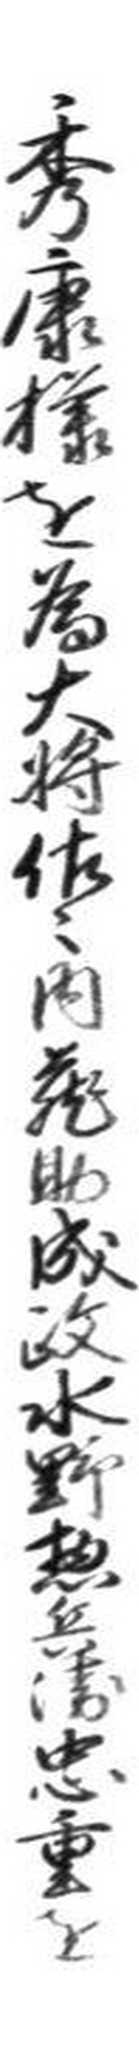秀康様を為大将佐々内蔵助成政水野惣兵衛忠重を
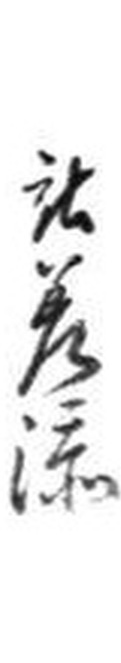被差添
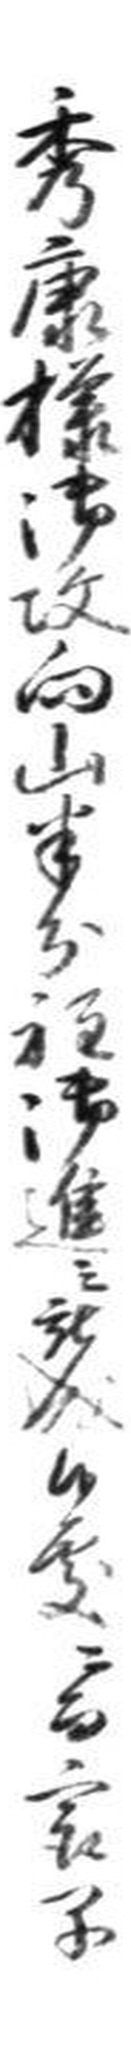秀康様御攻向山半分程御進ミ被成候処ニ而最早
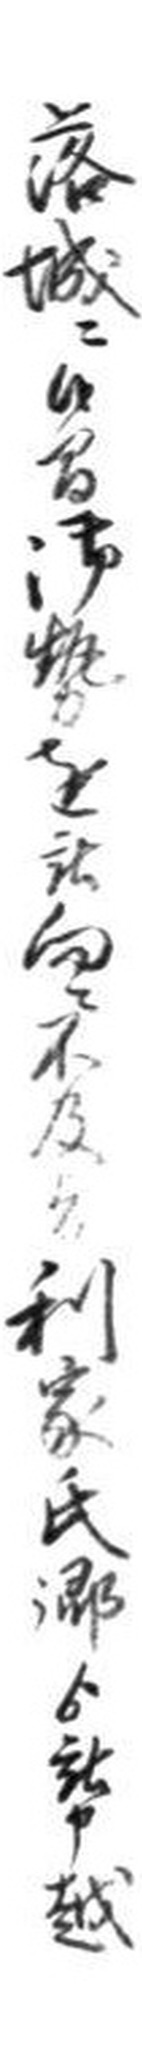落城ニ候間御勢を被向ニ不及旨利家氏郷ゟ被申越
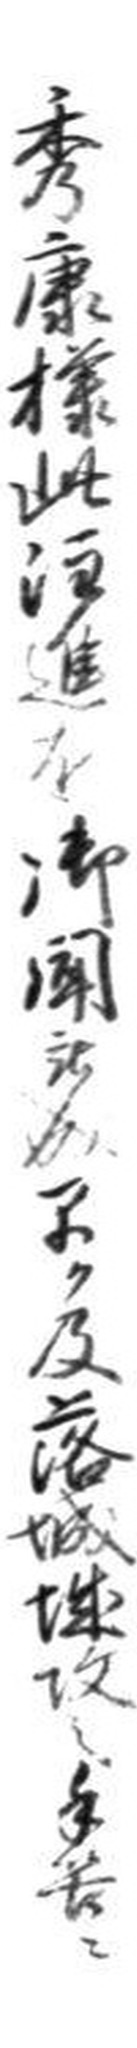秀康様此注進を御聞被成早ク及落城城攻之手筈ニ
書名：家譜 一 秀康公 従天正二年到慶長十二年
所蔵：福井県文書館 Fukui Prefectural Archives
